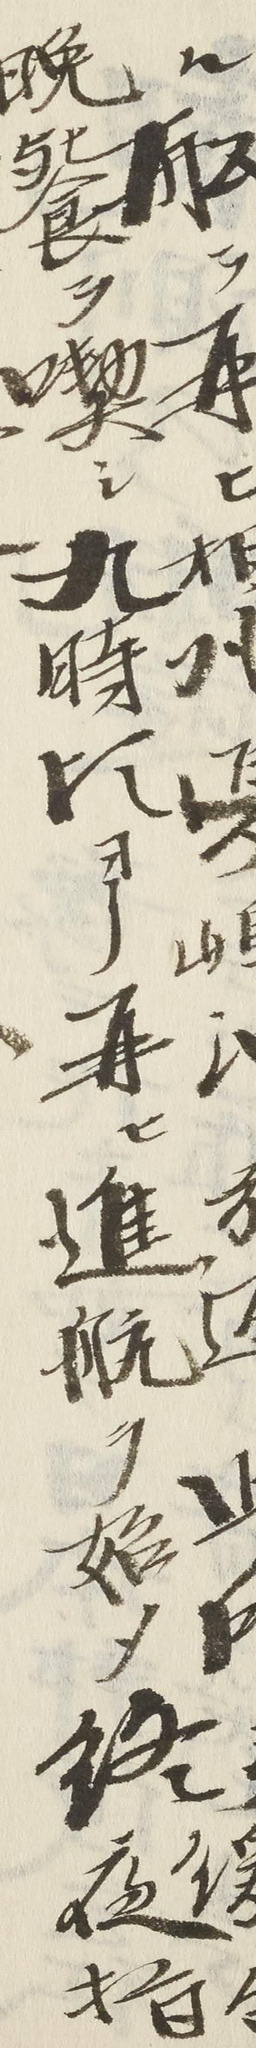晩餐ヲ喫シ九時頃ヨリ再ヒ進航ヲ始メ終夜指
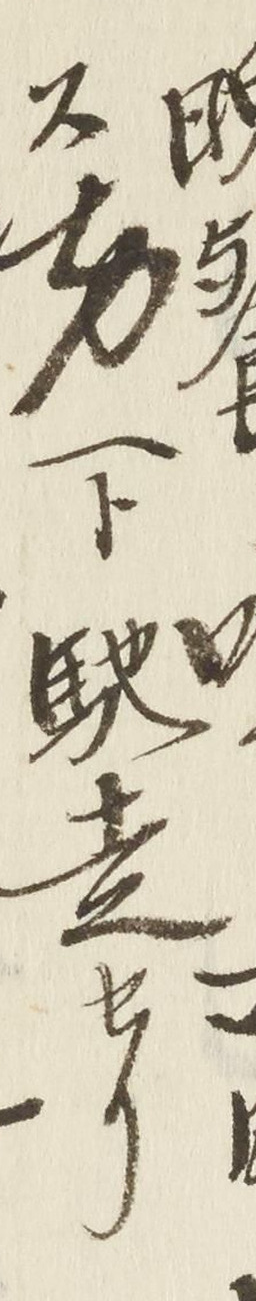ㇲ方へと馳走セリ
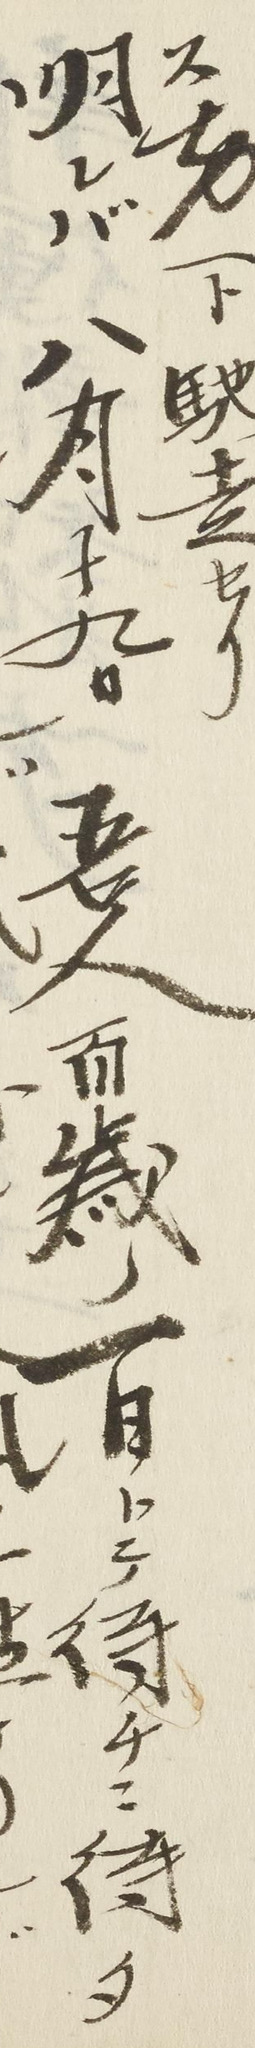明レバ八月十九日吾人百歳ノ一日トテ待チニ待タ
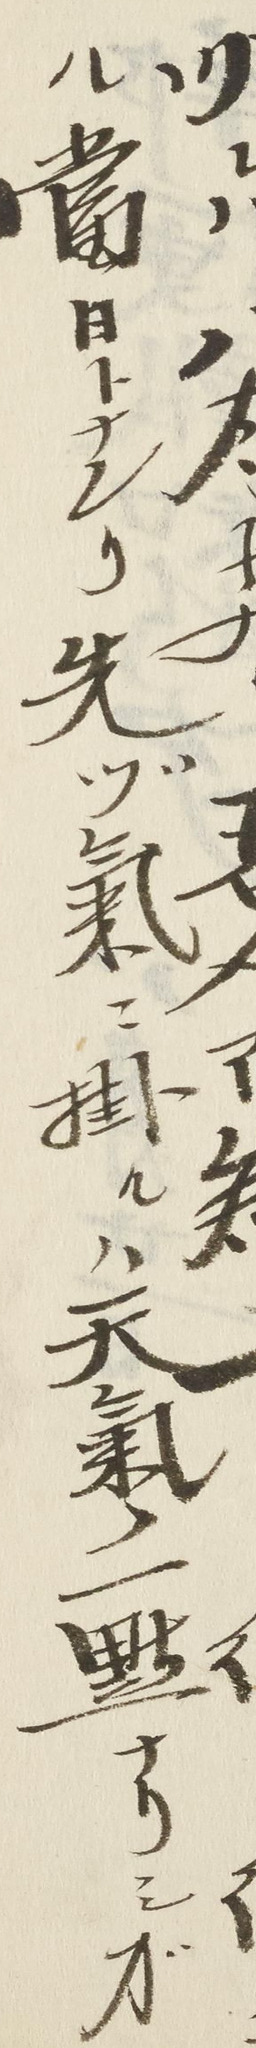ㇽ当日ㇳナレリ先ヅ気二掛ㇽハ天気ノ一点ナリシガ
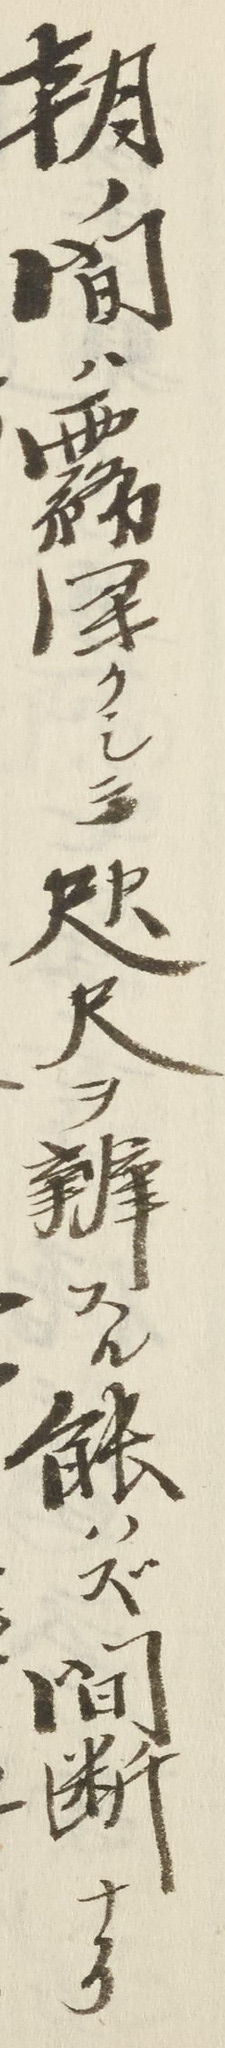朝ノ間ハ霧深クシテ咫尺ヲ弁スル能ハズ間断ナク
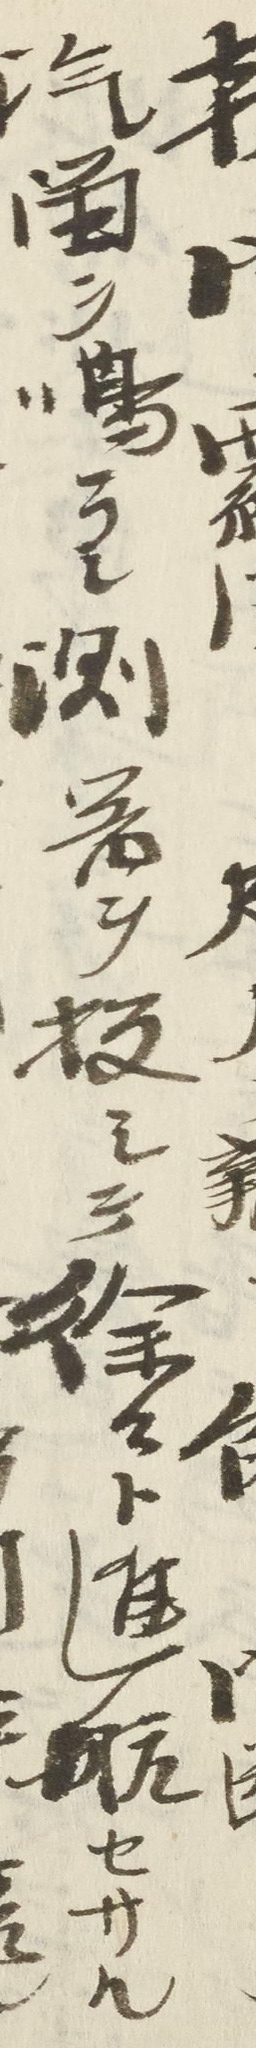汽笛ヲ鳴ラシ測器ヲ技シテ除々ㇳ進航セサル
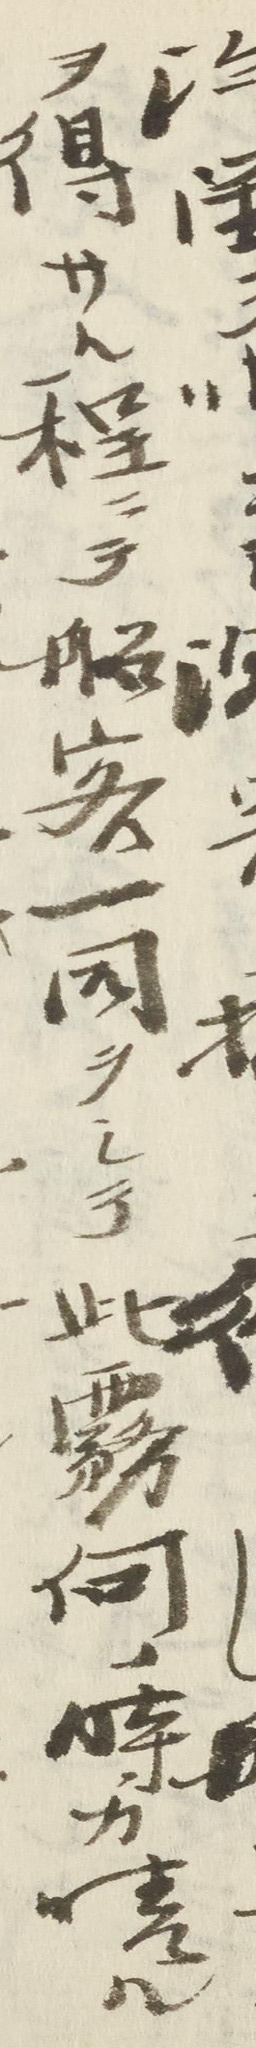ヲ得サル程ニテ船客一同ヲシテ此霧何ノ時カ晴ㇽ
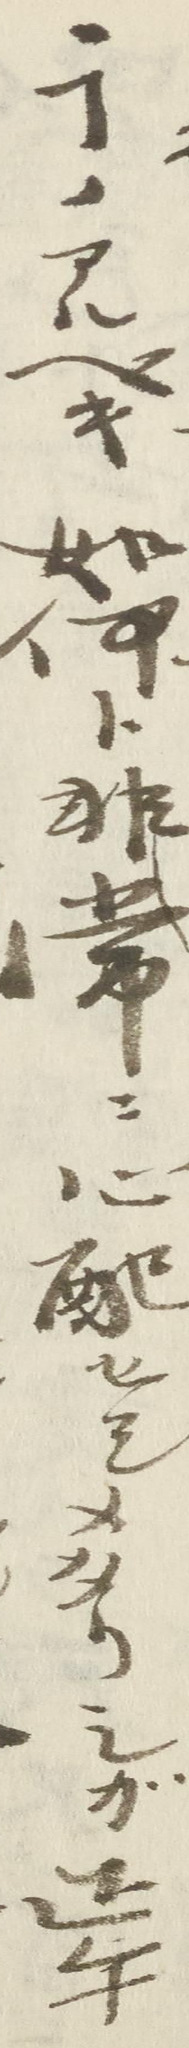ゝコトノアルベキ如何ㇳ非常二心配セシメタリシガ正午
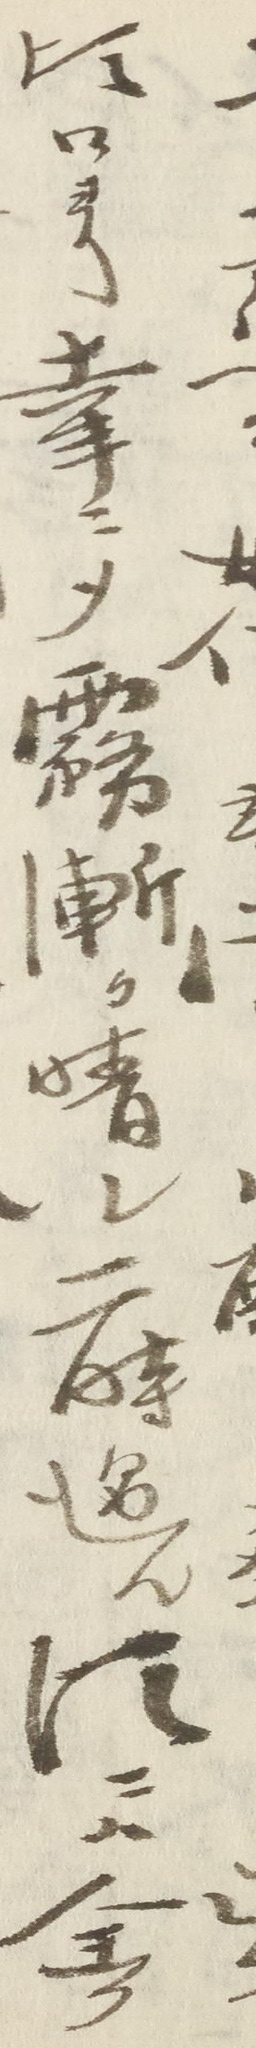頃ロヨリ幸二ソ霧漸ク晴レ二時過ㇽ頃二ハ全ク
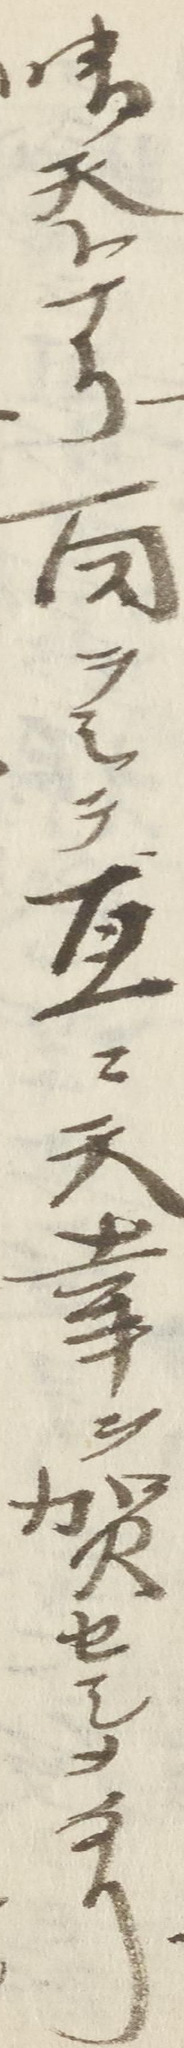晴天トナリ一同ヲシテ互二天幸ヲ賀セシソナリ
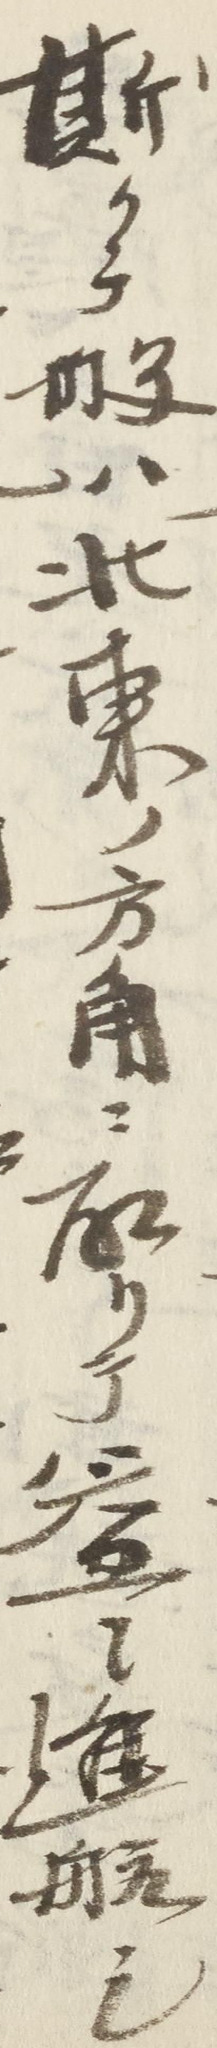斯クテ船ハ北東ノ方角二取リテ益々進航シ
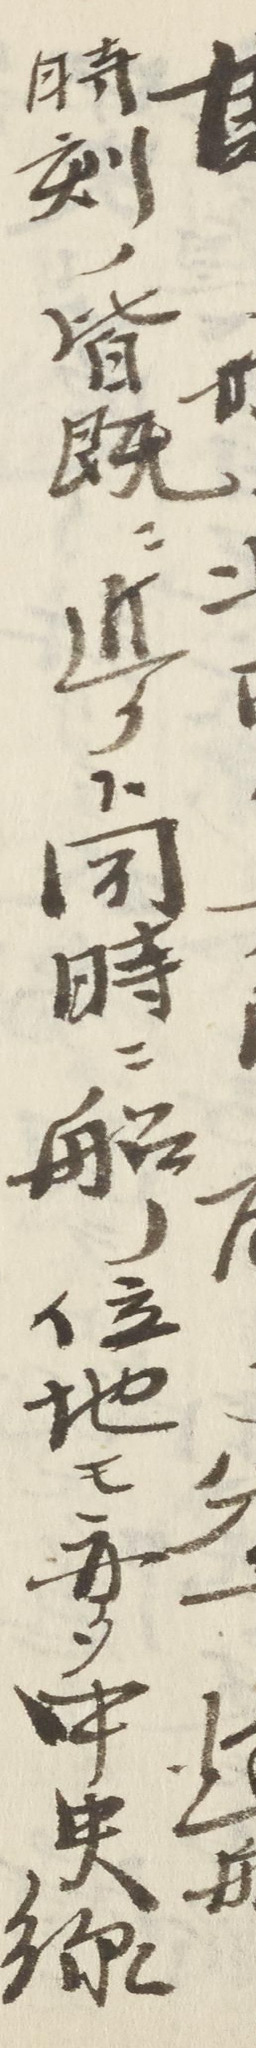時刻ノ皆既二近くㇳ同時二船ノ位地モ亦タ中央線
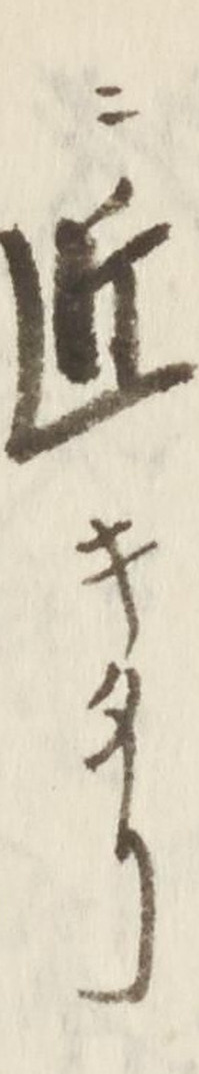二近キタリ
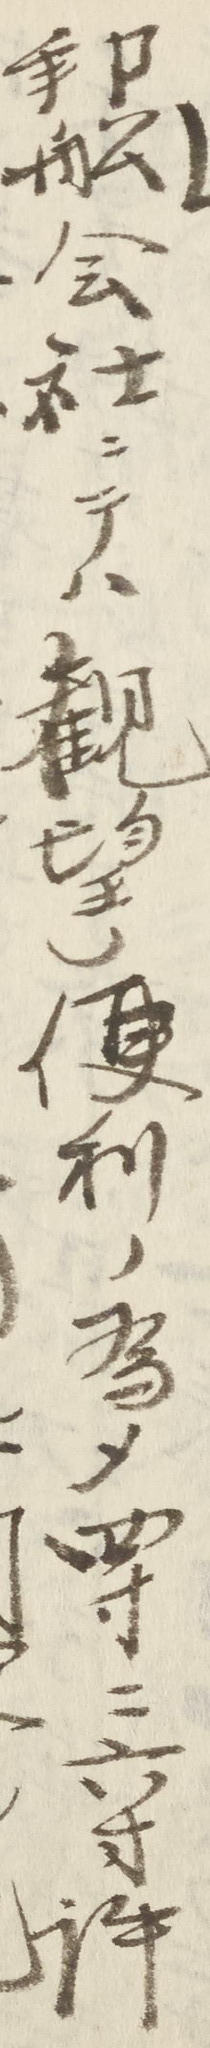郵船会社ニテハ観望便利ノ為メ四寸二六寸許
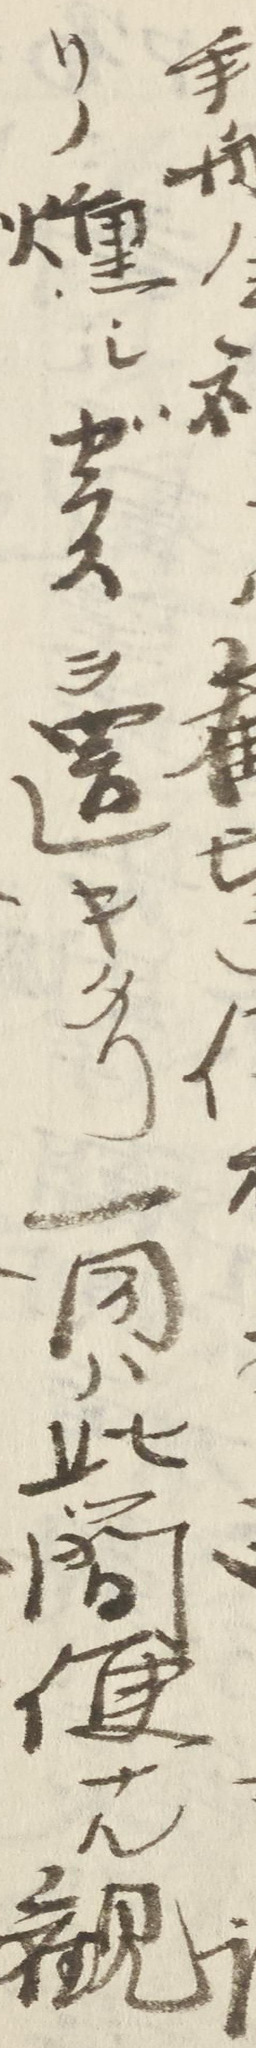リノ燻シガラスヲ置キタリ一同ハ此簡便ナル観
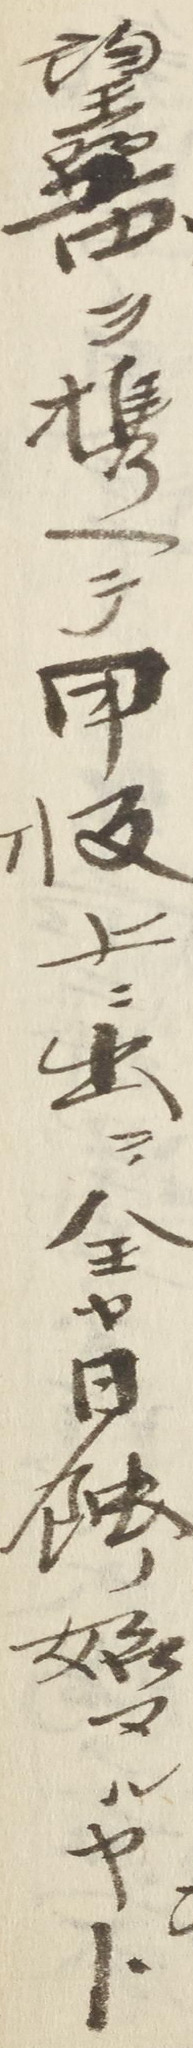望器ヲ携ヘテ甲板上二出テ全キ日蝕ノ始マルヤト
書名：日蝕録　全
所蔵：東京大学地震研究所図書室 Earthquake Research Institute Library, The University of Tokyo, JAPAN
